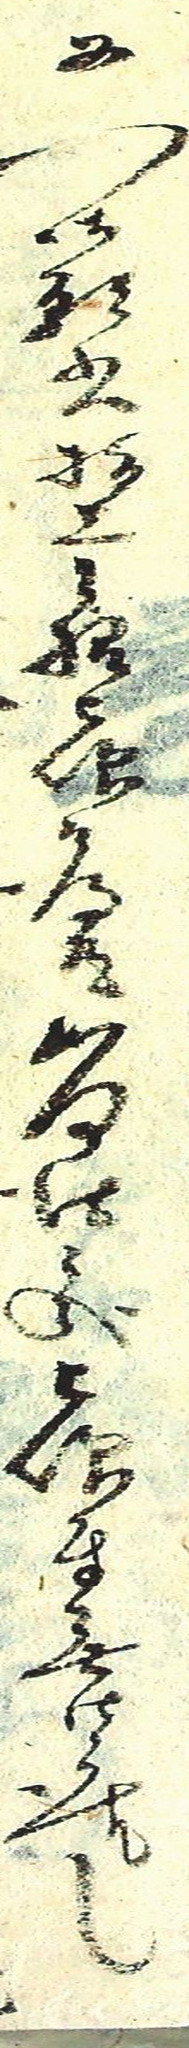右御願書指上候様被仰候得共如何仕候哉被仰付無御座候也
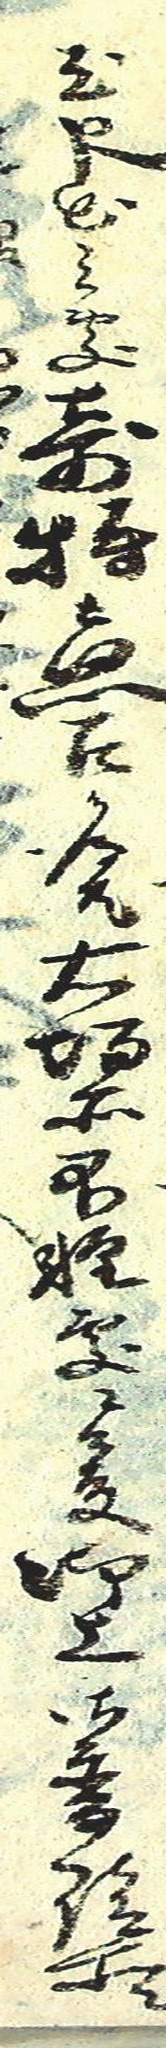尤申出之処奇特被思召候得共右場所不軽処に候故御上御普請所に
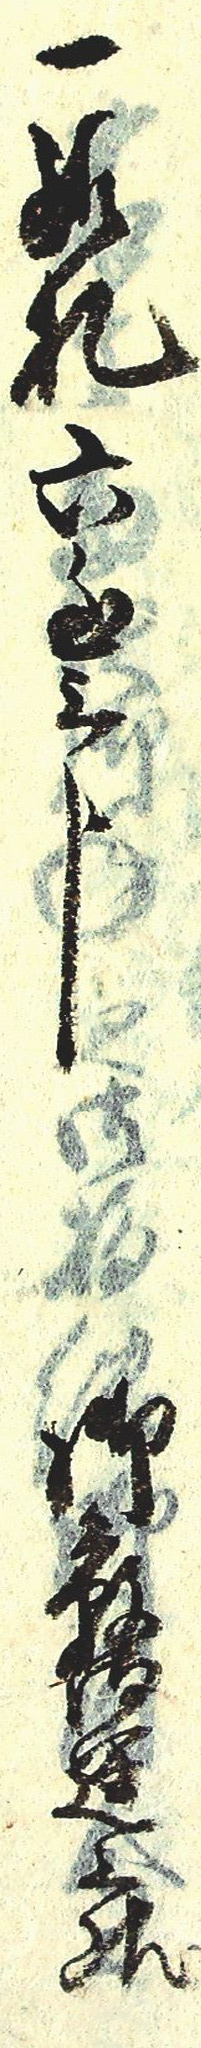一銀札六匁三分御藪運上銀
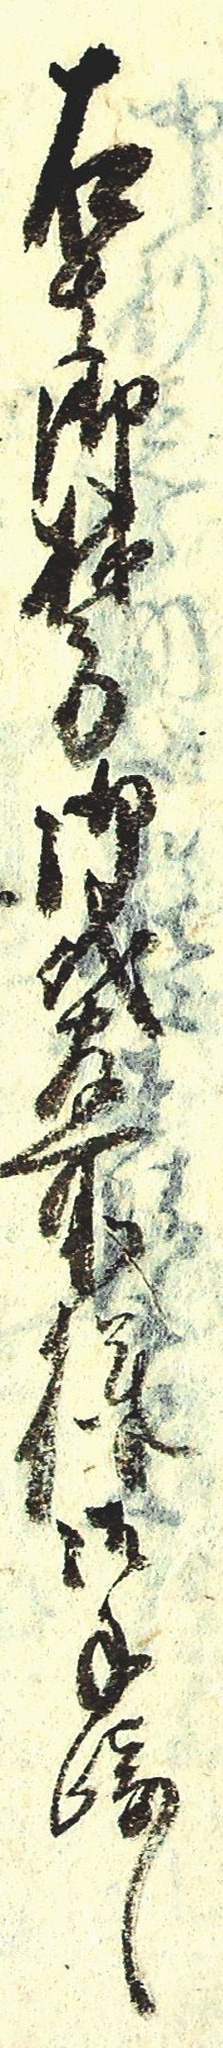右は御林方御代官所様御手崎へ
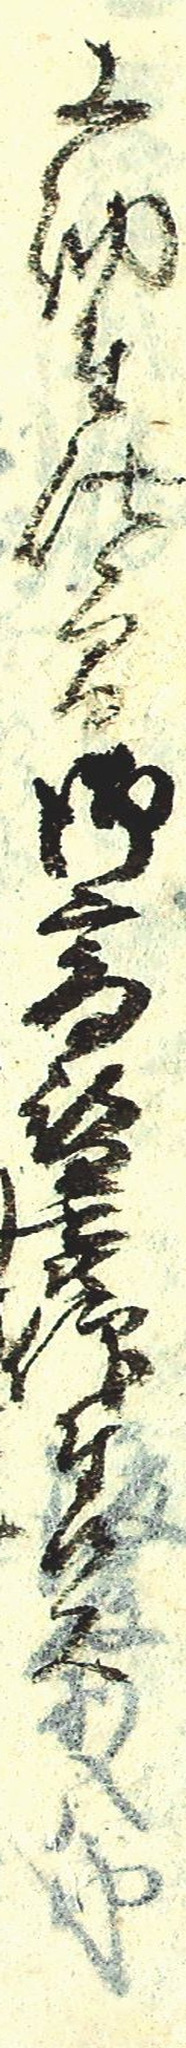上納奉仕候間御書替可被仰付候以上
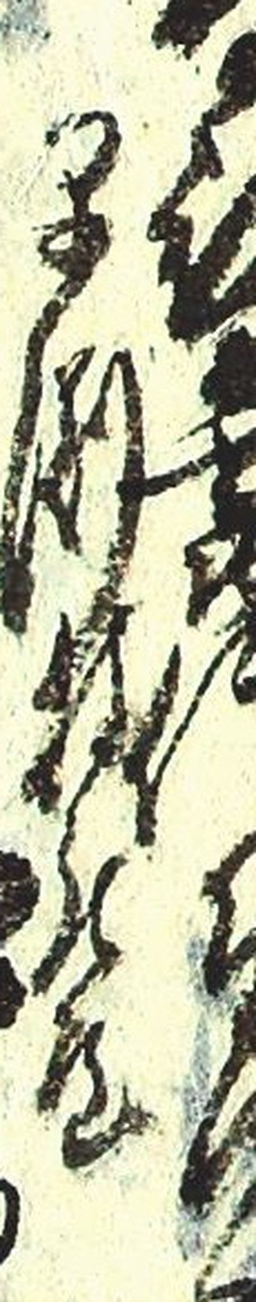早淵村庄屋
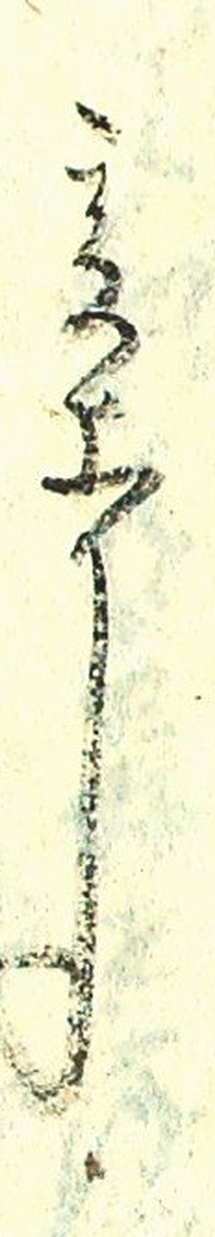亥十一月
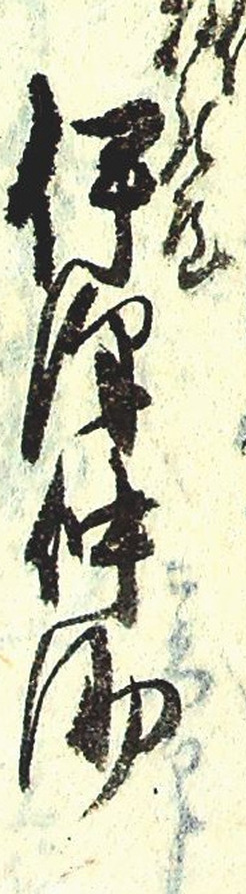伊沢仲助
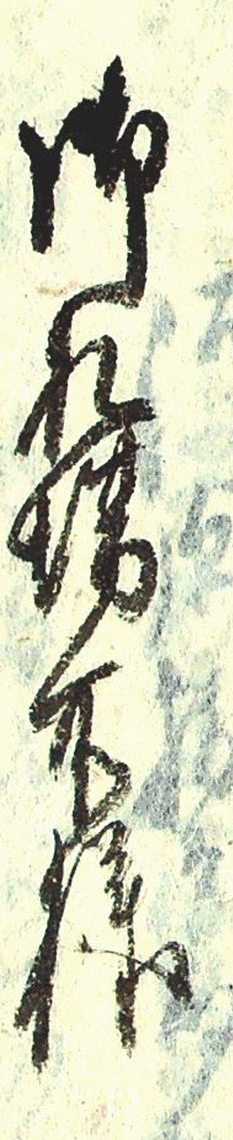御札場所様

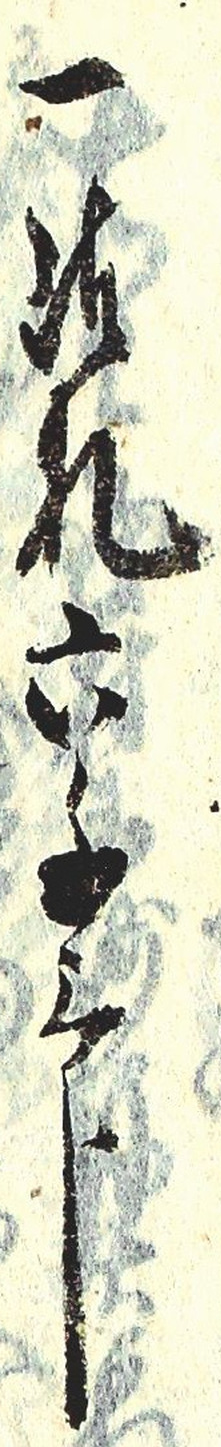一銀札六匁三分
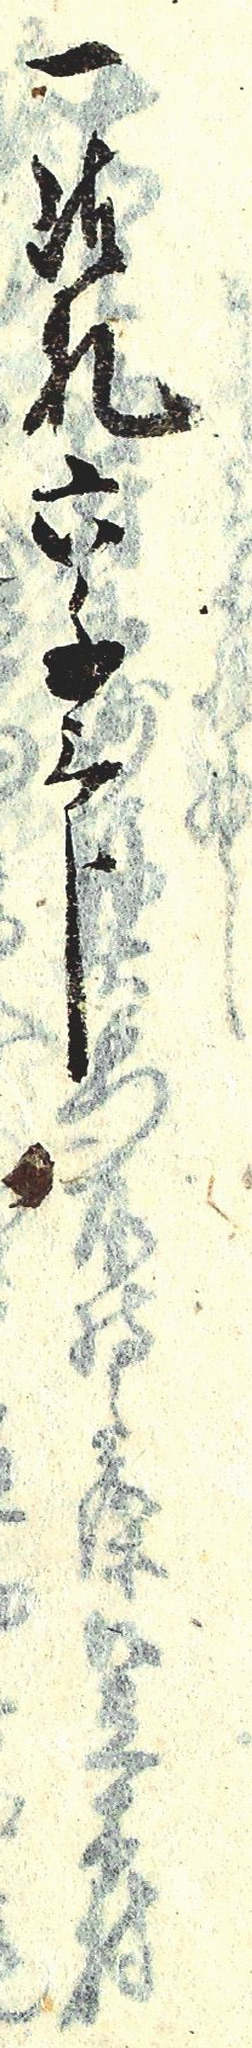一銀札六匁三分
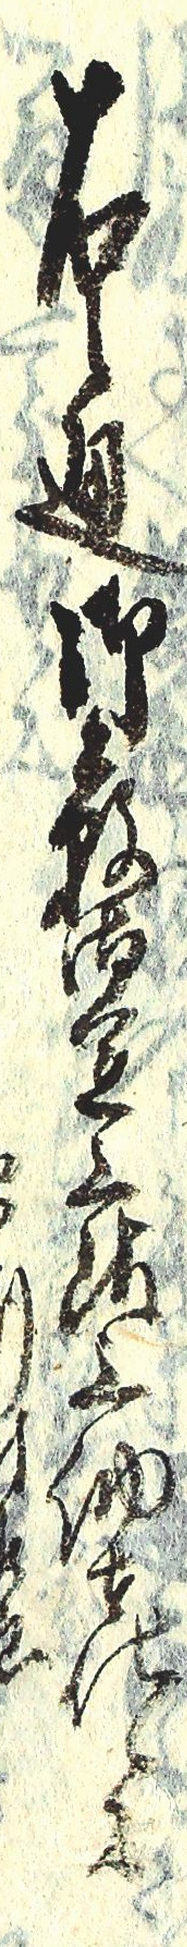右之通御藪御運上銀上納奉仕候以上
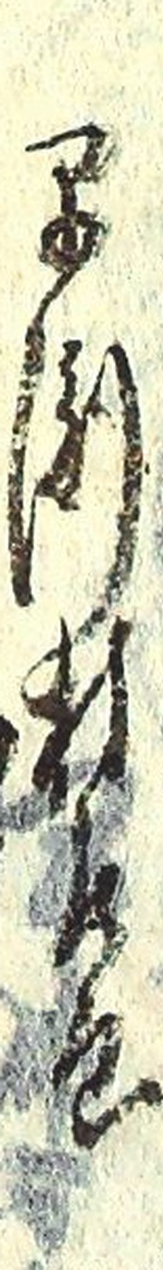早淵村庄屋
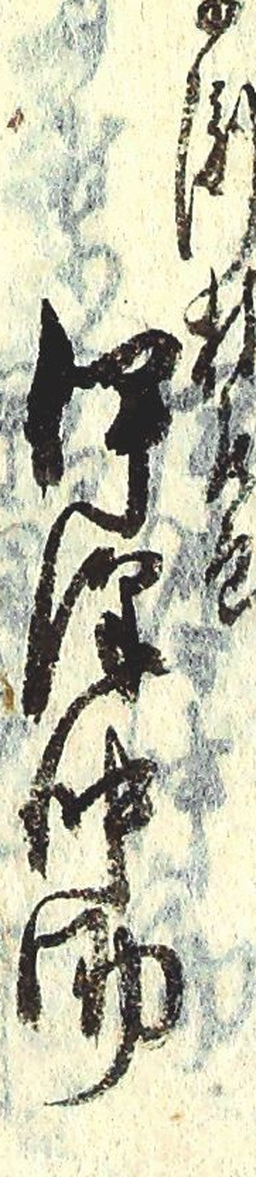伊沢仲助
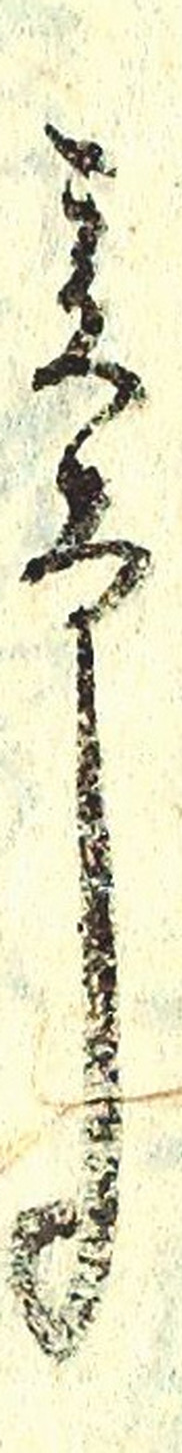亥十一月
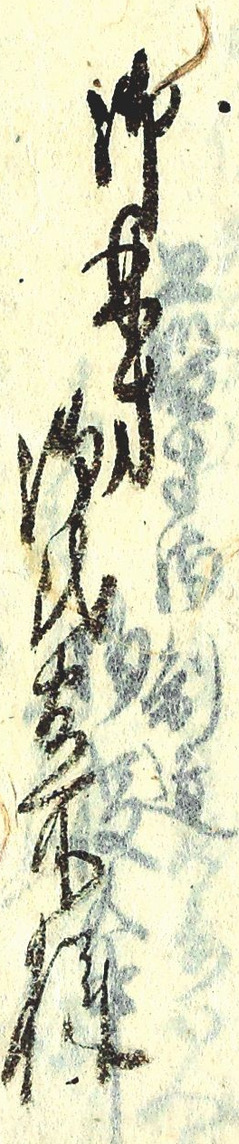御代官所様
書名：諸御願書控(弐番）
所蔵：鳴門教育大学 Naruto University of Education
